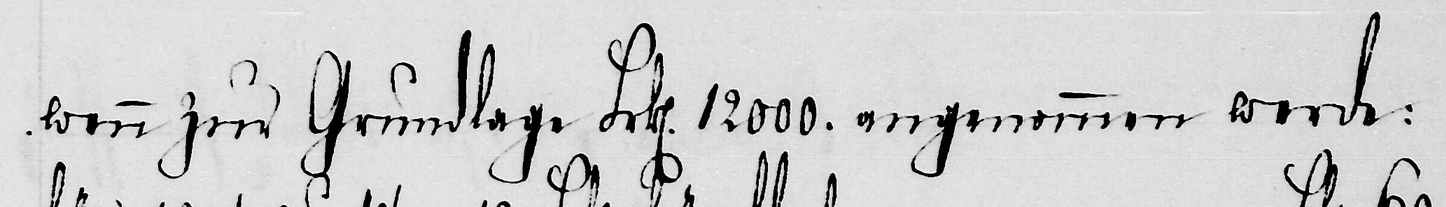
wenn zur Grundlage Frk[en]. 12000. angenommen werde:
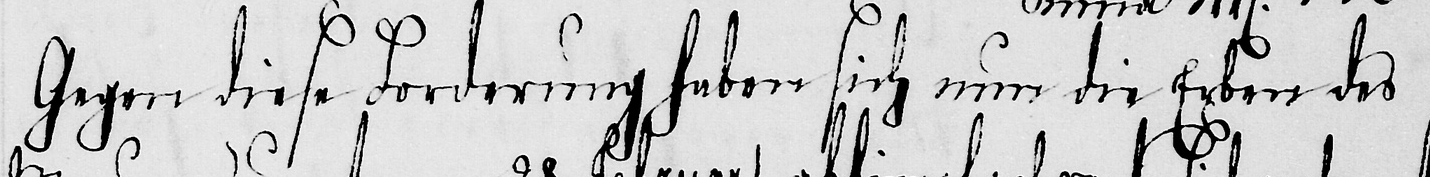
Gegen diese Forderung haben sich nun die Erben des
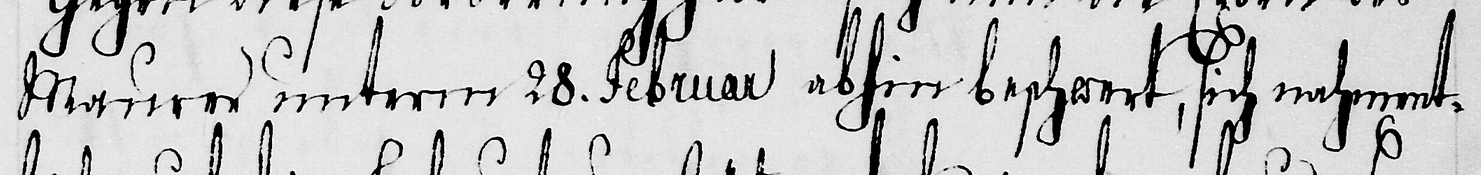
Maurer unterm 28. Februar abhin beschwert, sich nahment¬
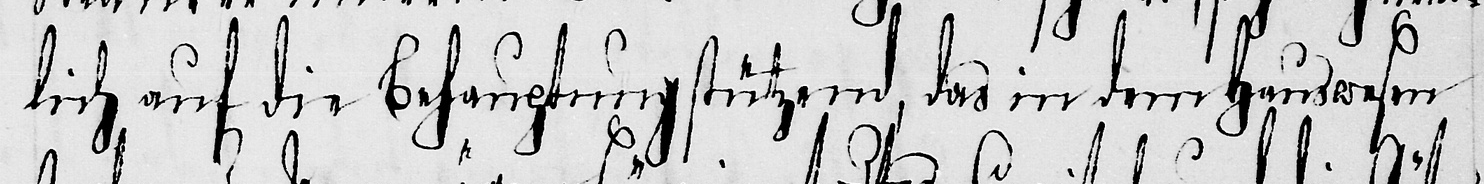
lich auf die Behauptung stützend, das in dem Hauswesen
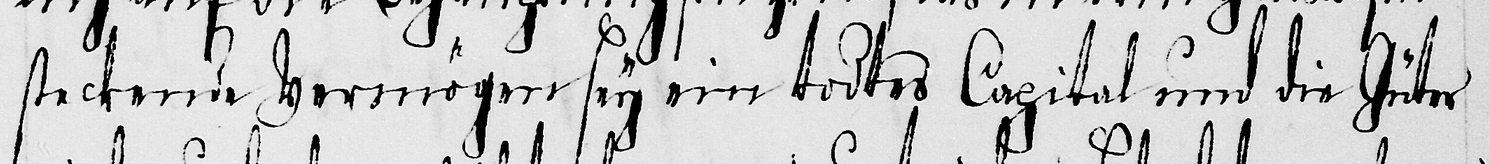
steckende Vermögen sey ein todtes Capital und die Güter
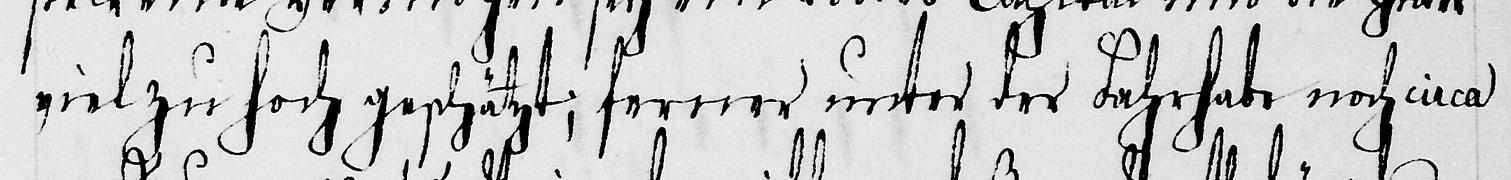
viel zu hoch geschätzt; ferner unter der Fahrhabe noch cir¬
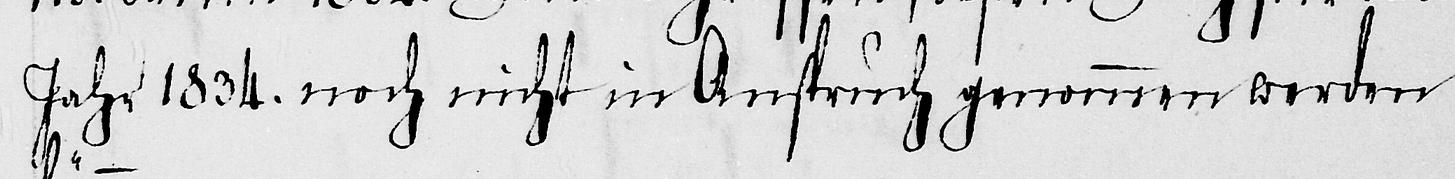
Jahr 1834. noch nicht in Anspruch genommen werden
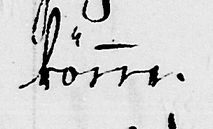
könne.
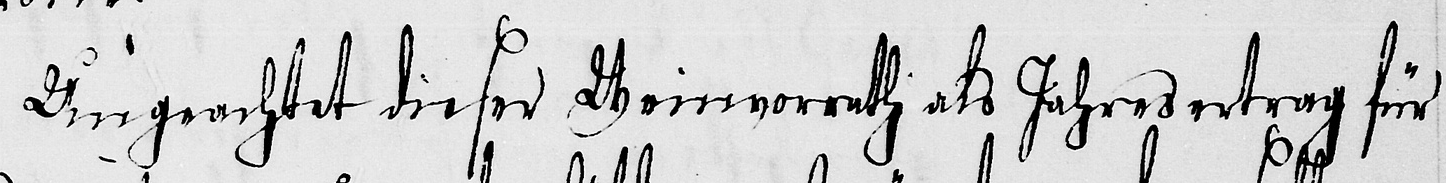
Ungeachtet dieser Weinvorrath als Jahresertrag für
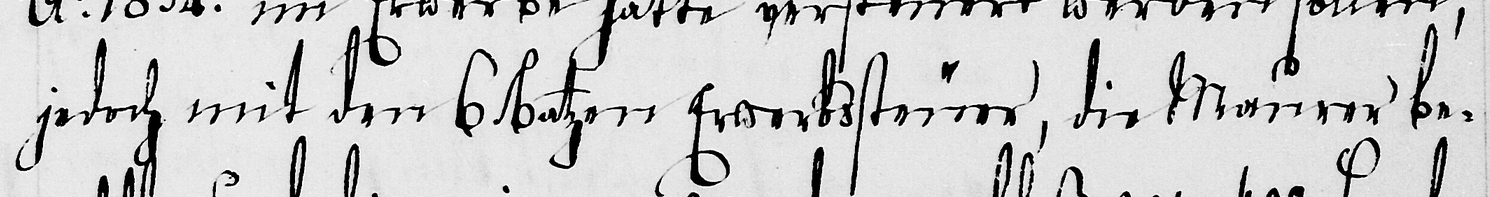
jedoch mit den 6 Batzen Erwerbssteuer, die Mauerer be¬
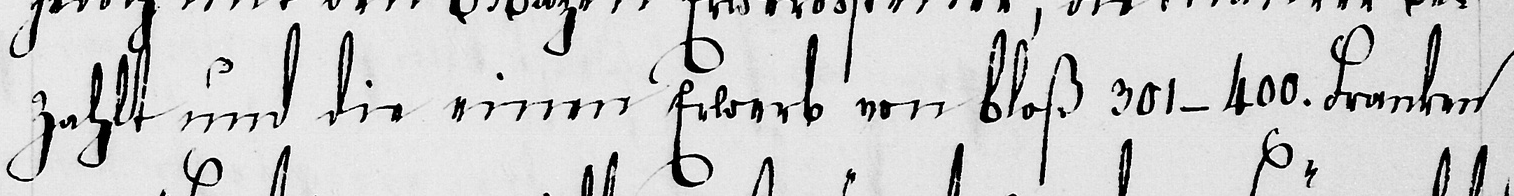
zahlt und die einen Erwerb von bloß 301–400. Franken
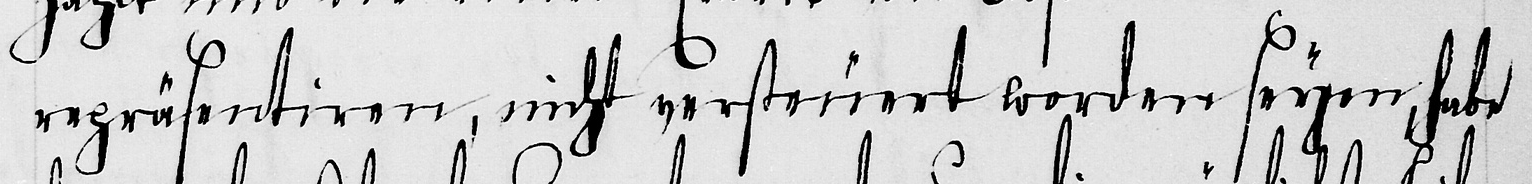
repräsentiren, nicht versteuert worden seyen, habe
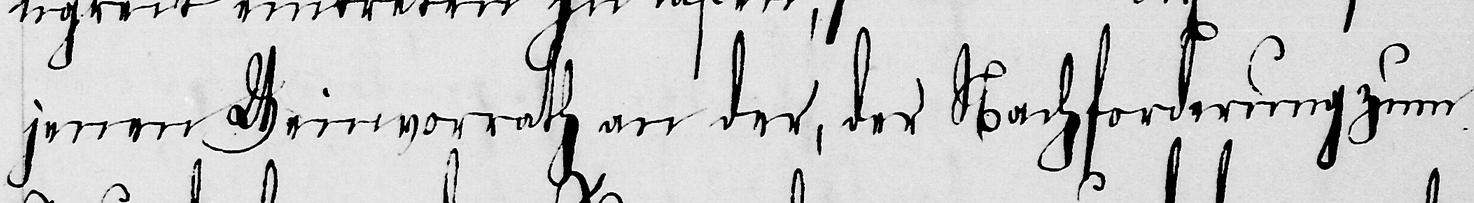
jenen Weinvorrath an der, der Nachforderung zum
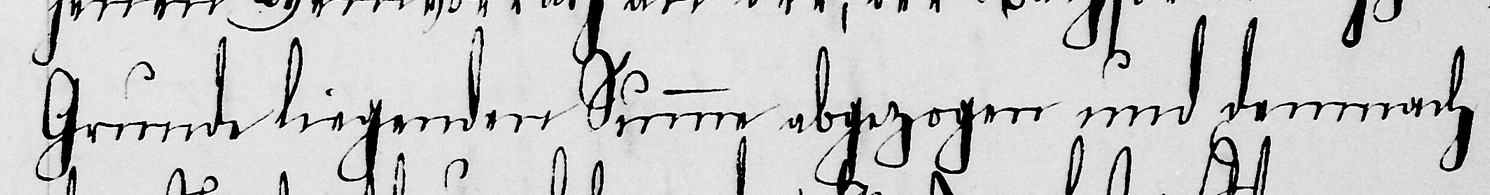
Grunde liegenden Summe abgezogen und demnach
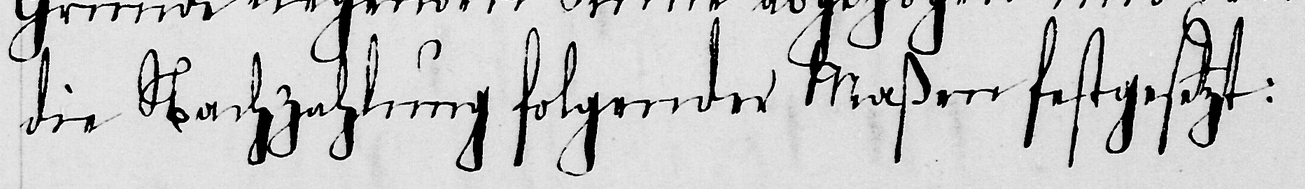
die Nachzahlung folgender Maßen festgesetzt:
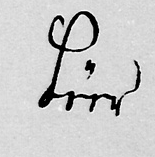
für
